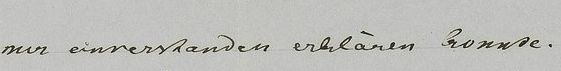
nur einverstanden erklären konnte.
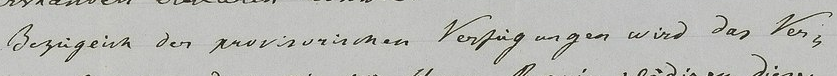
Bezüglich der provisorischen Verfügungen wird das Ver-
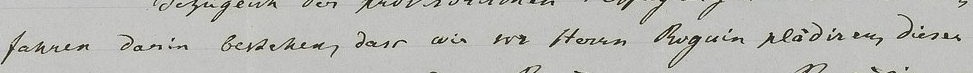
fahren darin bestehen, dass wir vor Herrn Rognin plädiren, dieser
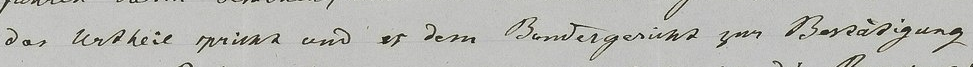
das Urtheil spricht und es dem Bundesgericht zur Bestätigung
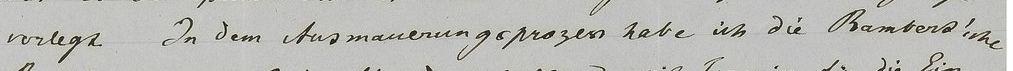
vorlegt. In dem Ausmauerungsprozess habe ich die Rambert'sche
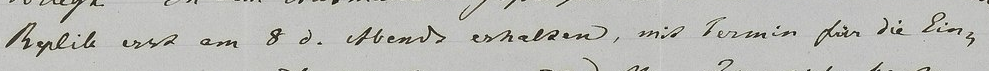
Replik erst am 8. d. Abends erhalten, mit Termin für die Ein-
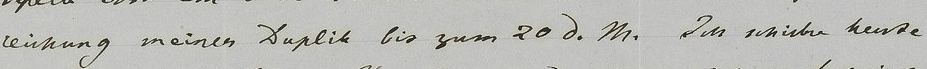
reichung meiner Duplik bis zum 20. d. M. Ich schicke heute
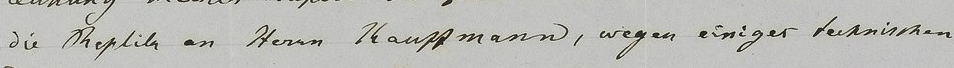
die Replik an Herrn Kauffmann, wegen einiger technischen
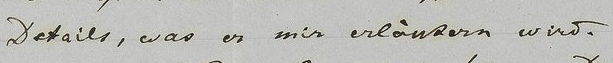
Details, was er mir erläutern wird.
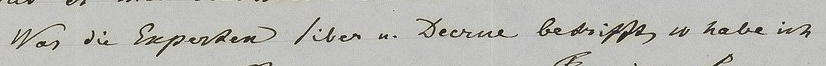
Was die Experten Siber u. Decrue betrifft, so habe ich
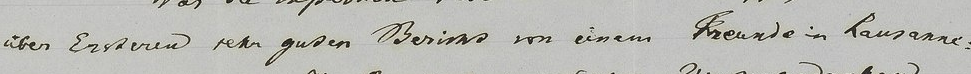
über Ersteren sehr guten Bericht von einem Freunde in Lausanne:
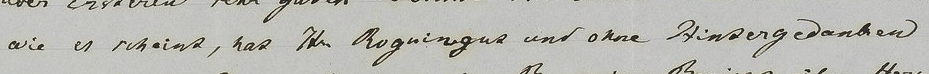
wie es scheint, hat Ihn Rognin gut und ohne Hintergedanken
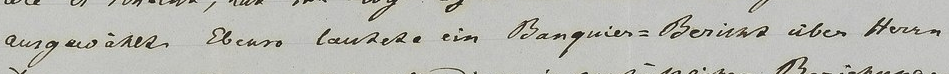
ausgewählt. Ebenso lautete ein Banquier-Bericht über Herrn
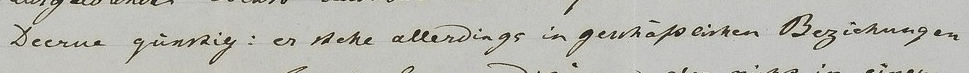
Decrue günstig: er stehe allerdings in geschäftlichen Beziehungen
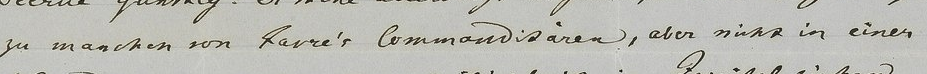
zu manchen von Favre's Commanditären, aber nicht in einer
